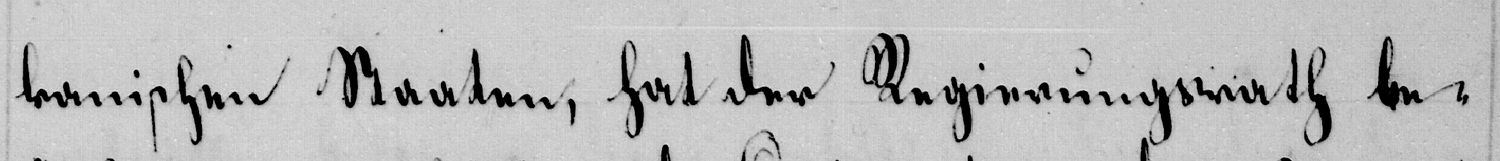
kanischen Staaten, hat der Regierungsrath be¬
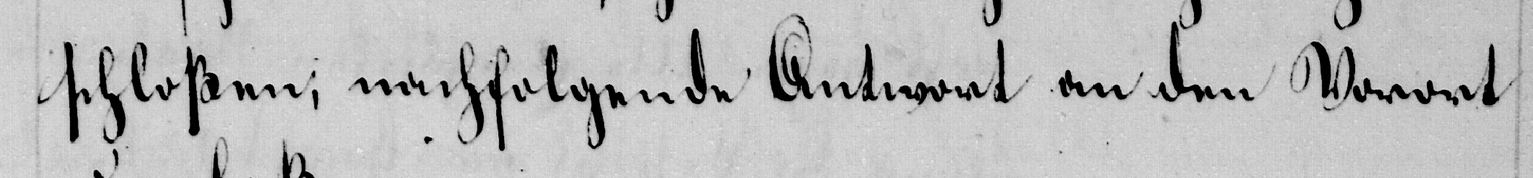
schloßen, nachfolgende Antwort an den Vorort
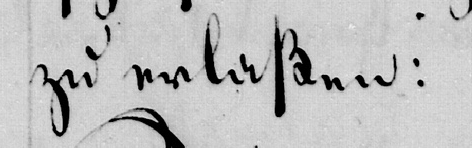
zu erlaßen:
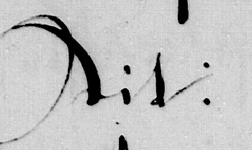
Tit:
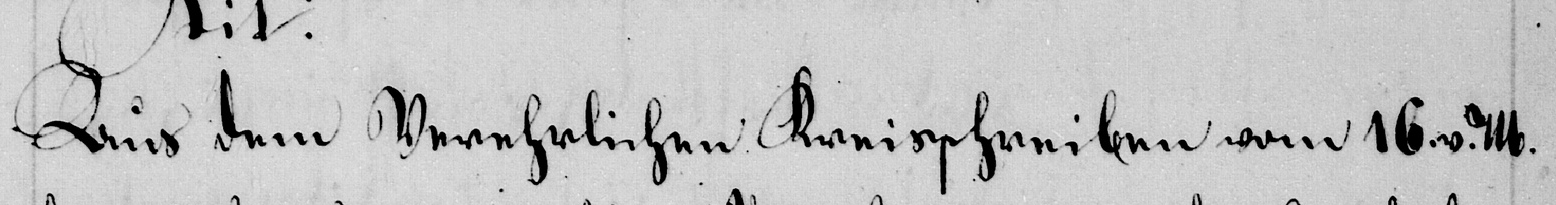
Aus dem Verehrlichen Kreisschreiben vom 16. v. M.
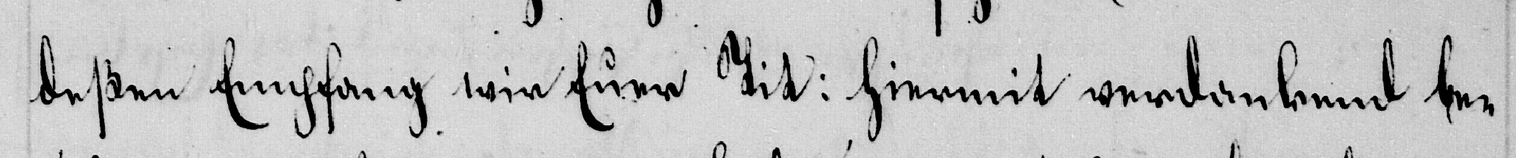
deßen Empfang wir Euer Tit: hiermit verdankend be¬
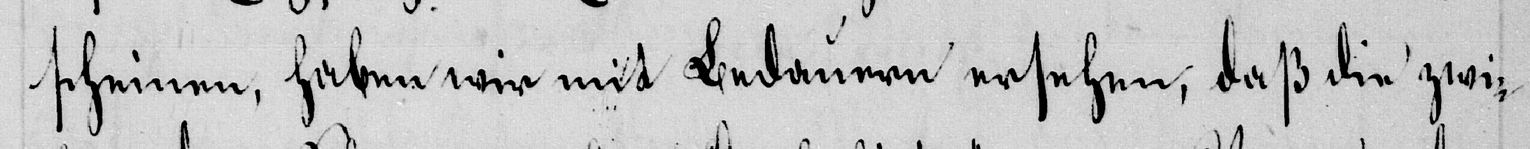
scheinigen, haben wir mit Bedauern ersehen, daß die zwi¬
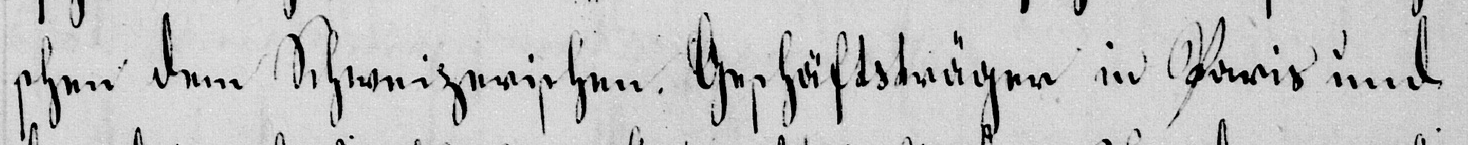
schen dem Schweizerischen Geschäftsträger in Paris und
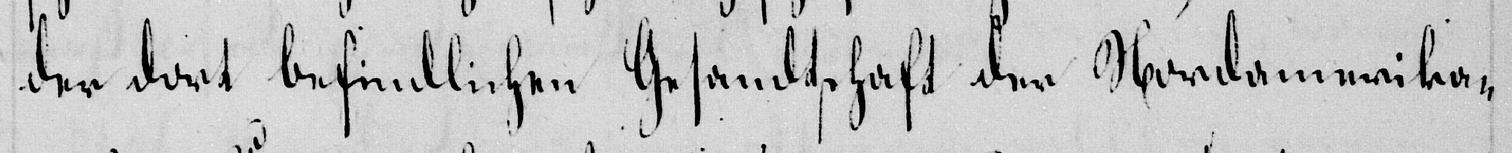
der dort befindlichen Gesandtschaft der Nordamerika¬
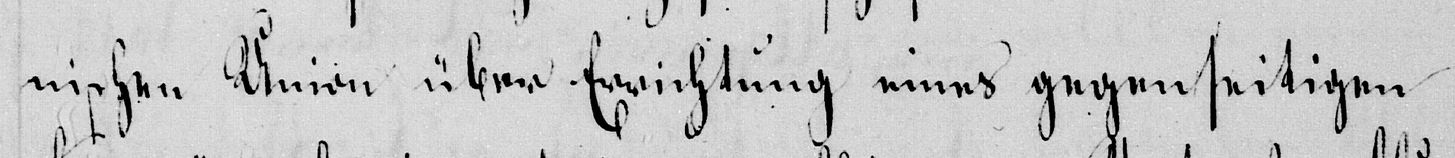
nischen Union über Errichtung eines gegenseitigen
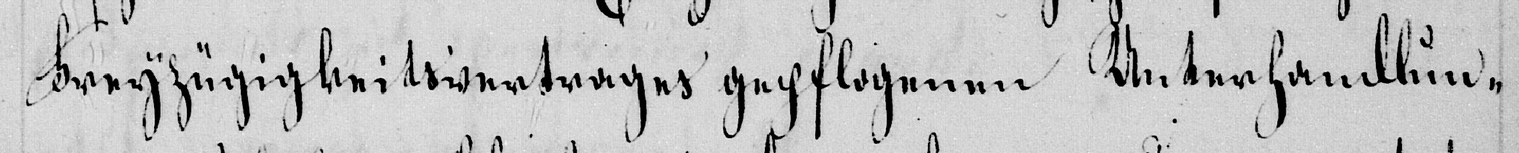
Freyzügigkeitsvertrages gepflogenen Unterhandlun¬
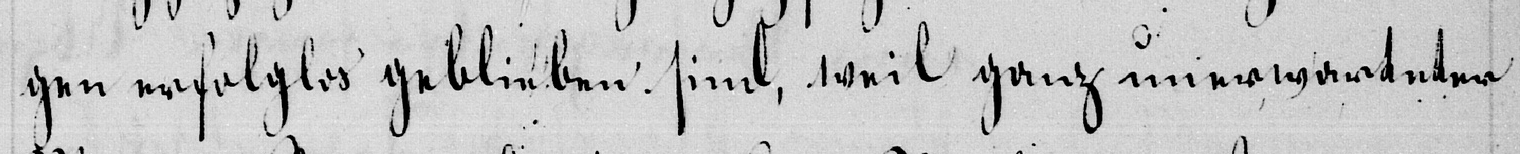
gen erfolglos geblieben sind, weil ganz unerwarteter
